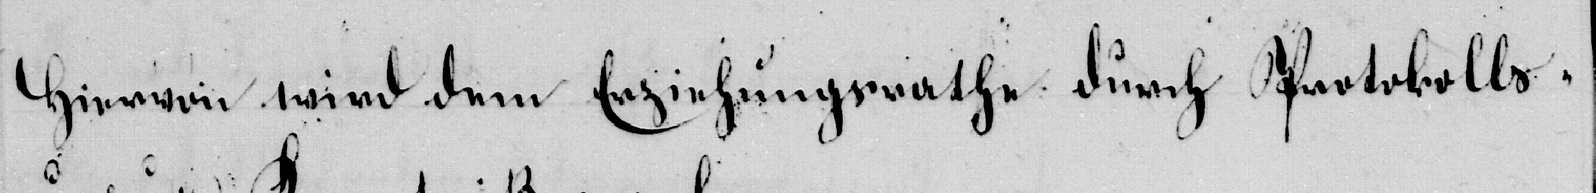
Hiervon wird dem Erziehungsrathe durch Protokolls¬
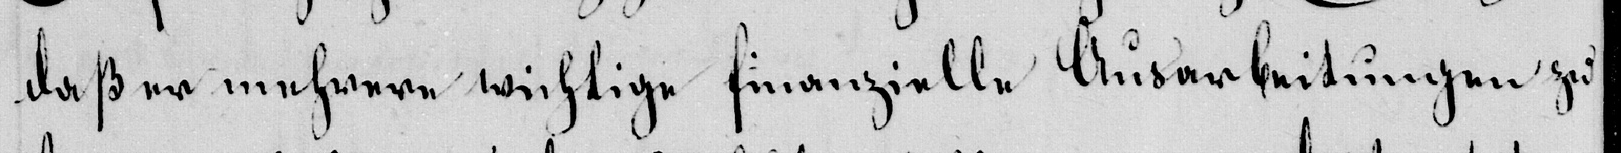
daß er mehrere wichtige finanzielle Ausarbeitungen zu
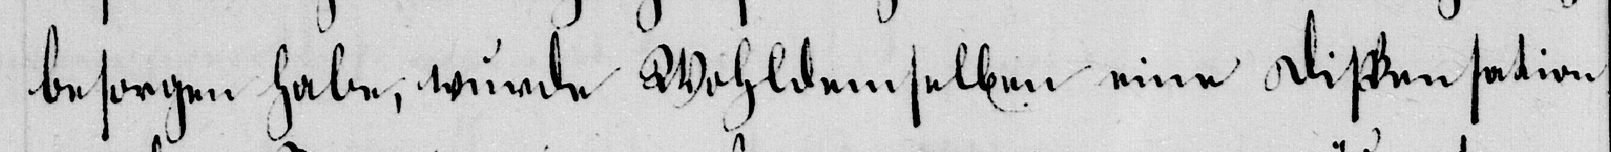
besorgen habe, wurde Wohldemselben eine Dispensation
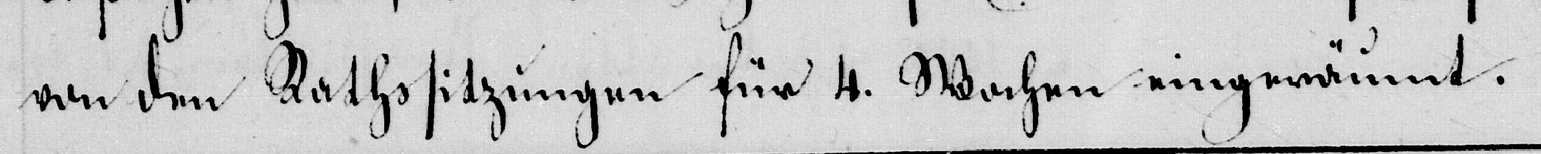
von den Rathssitzungen für 4. Wochen eingeräumt.
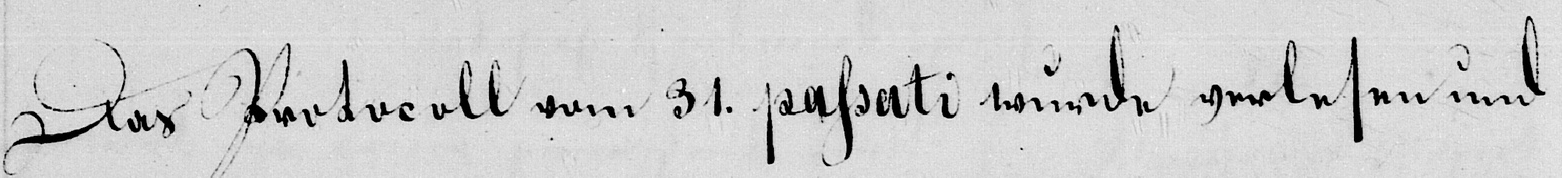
Das Protocoll vom 31. passati wurde verlesen und
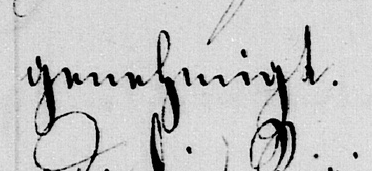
genehmigt.
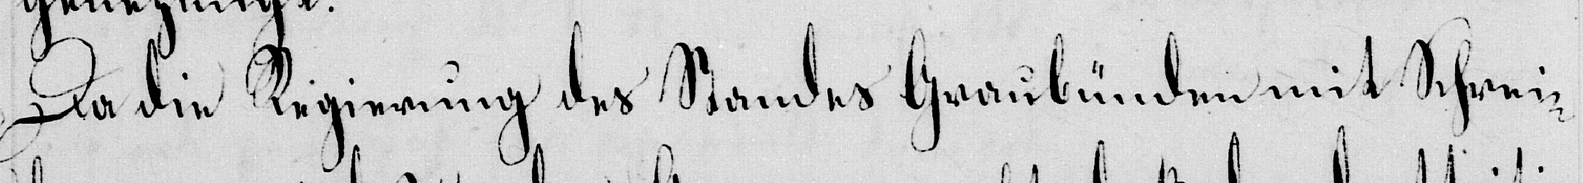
Da die Regierung des Standes Graubünden mit Schrei¬
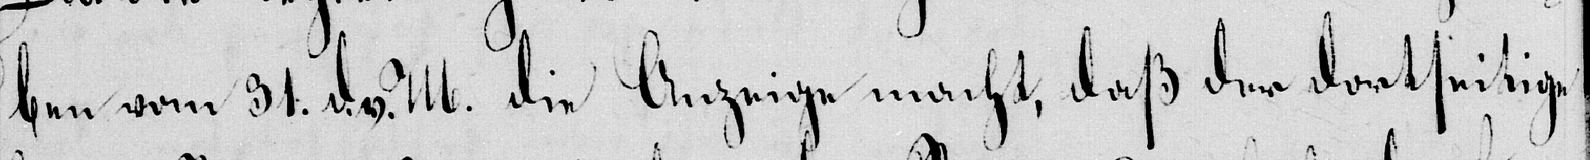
ben vom 31. d. v. M. die Anzeige macht, daß der dortseitige
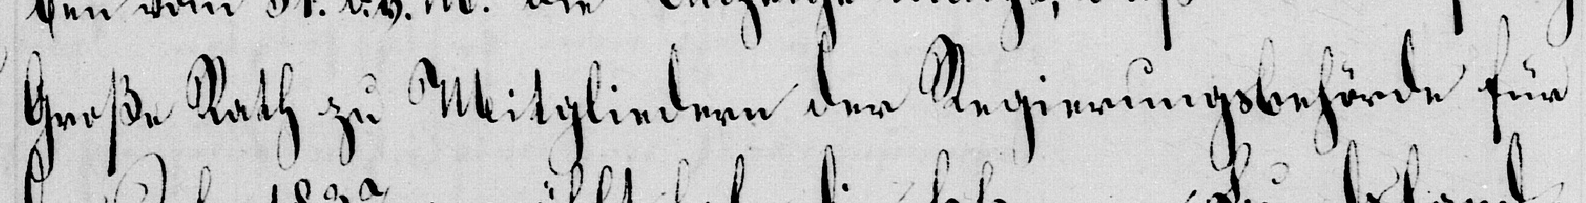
Große Rath zu Mitgliedern der Regierungsbehörde für
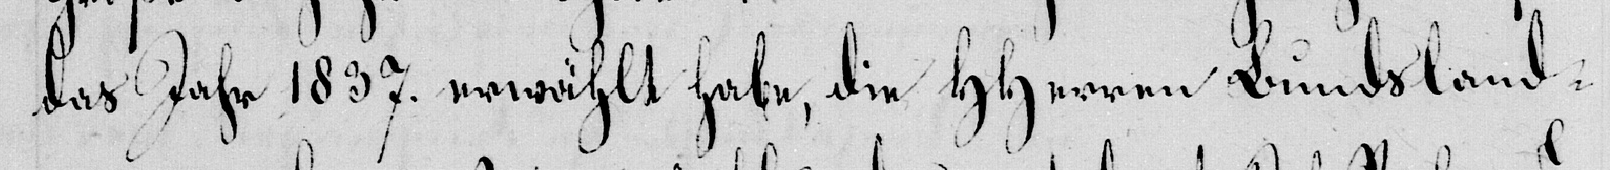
das Jahr 1837. erwählt habe, die HHerren Bundsland¬
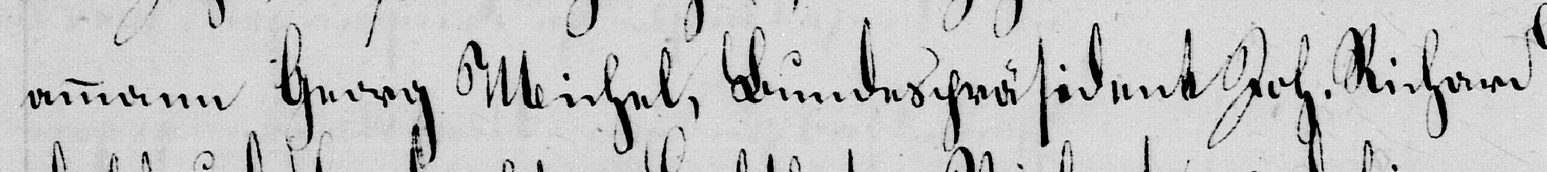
ammann Georg Michel, Bundespräsident Joh. Richard
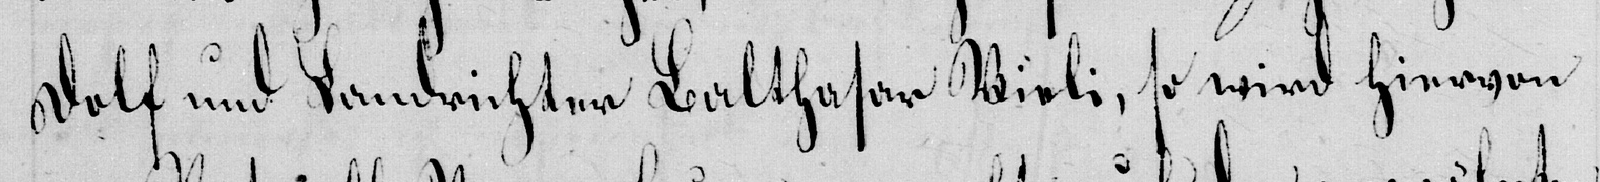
Dolf und Landrichter Balthasar Vieli, so wird hiervon
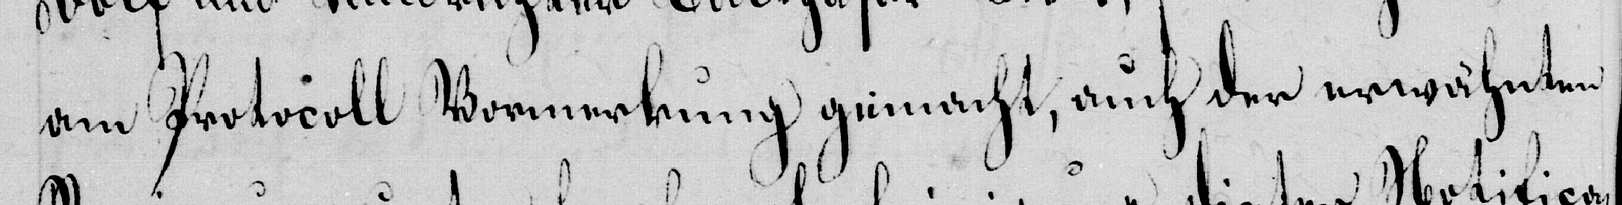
am Protocoll Vormerkung gemacht, auch der erwähnten
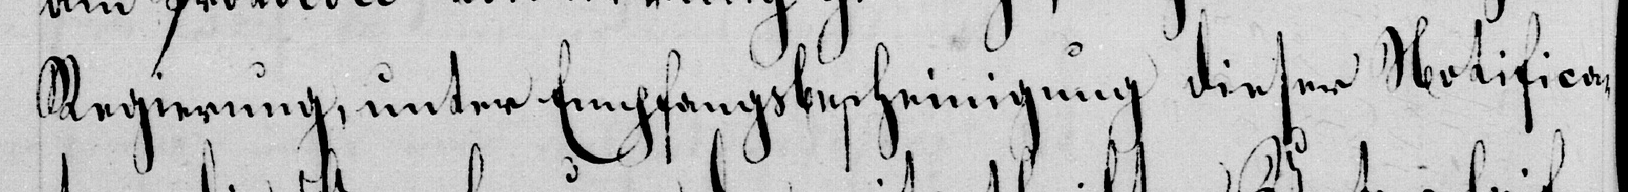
Regierung, unter Empfangsbescheinigung dieser Notifica¬
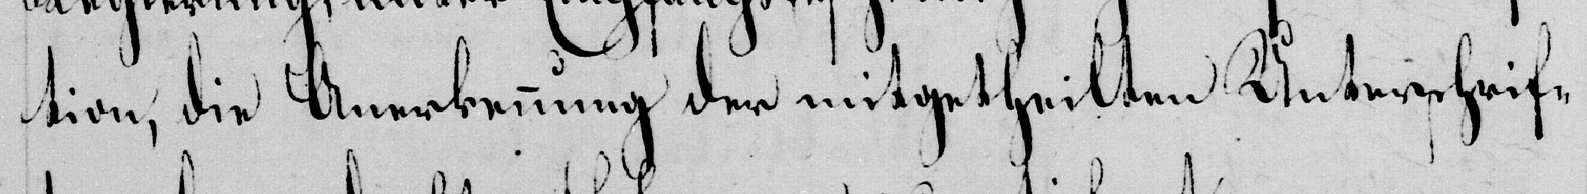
tion, die Anerkennung der mitgetheilten Unterschrif¬
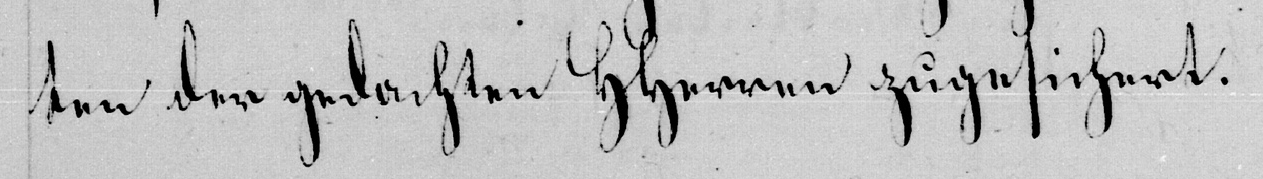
ten der gedachten HHerren zugesichert.
